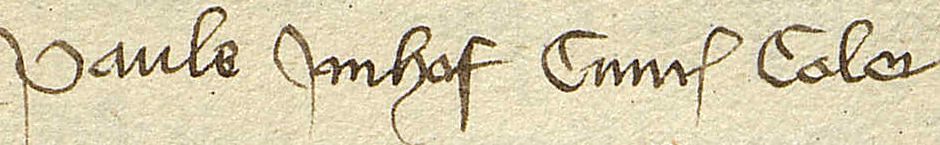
Pauls Imhof Cunr* Coler
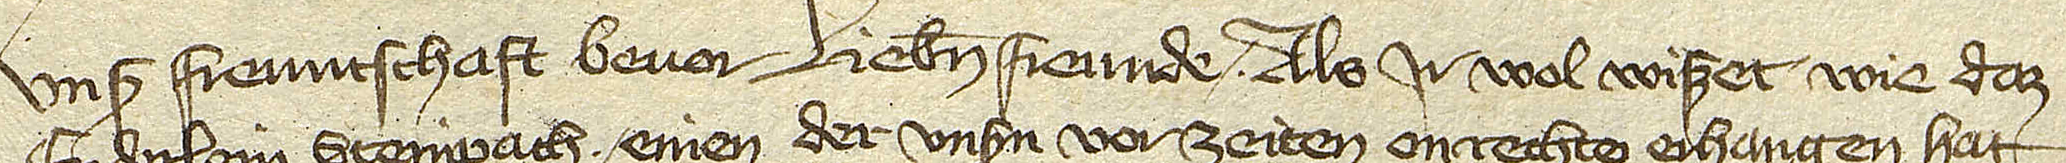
Vnſ* freuntſchaft beuor Liebn* freunde / . Als Ir wol wiſʒet wie daʒ
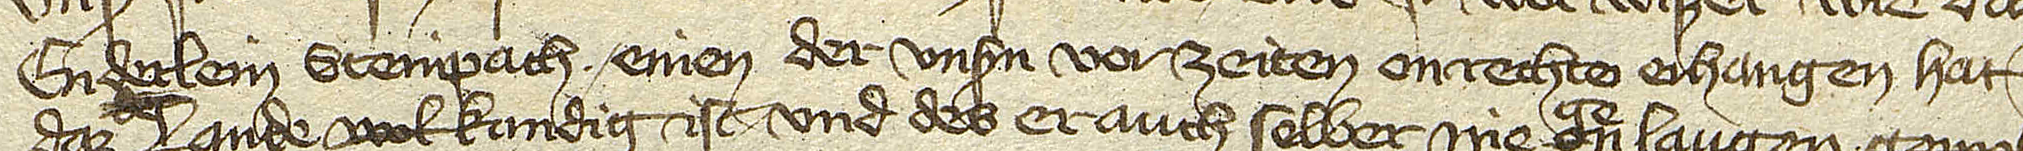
Enderlein Steinpach . / einen der vnſ*n vor cʒeiten onrechte erhangen hat
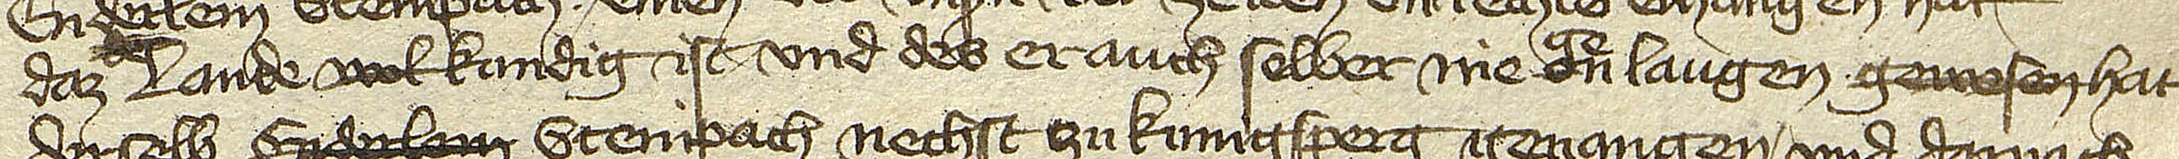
daʒ Lande wol kundig iſt / vnd des er auch ſelber nie on laugen geweſen hat
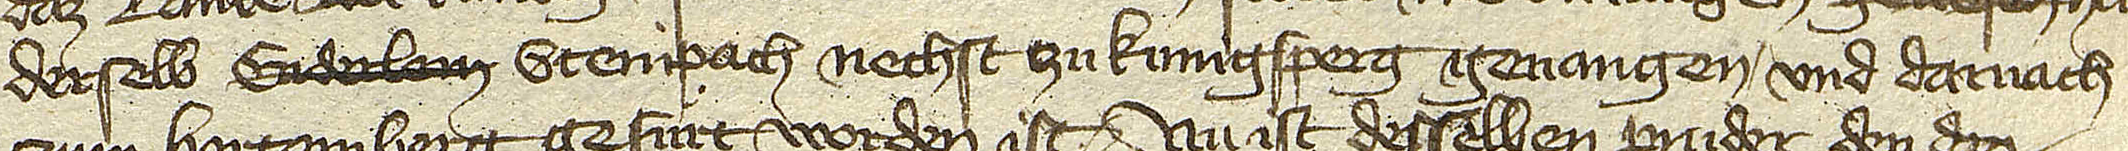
derſelb Enderlein Steinpach nechſt cʒu kunigſperg geuangen / vnd darnach
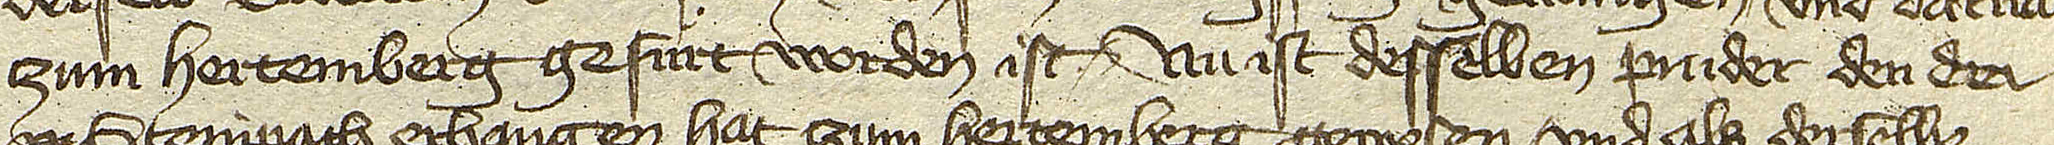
cʒum hertemberg gefürt worden iſt . / Nu iſt deſſelben pruder den der
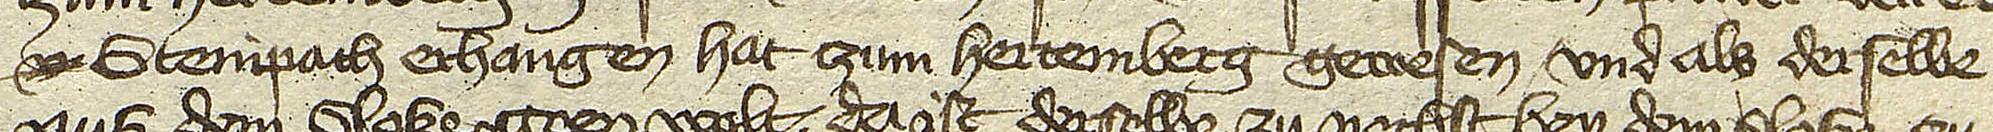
v Steinpach erhangen hat cʒum hertemberg geweſen / vnd als derſelbe
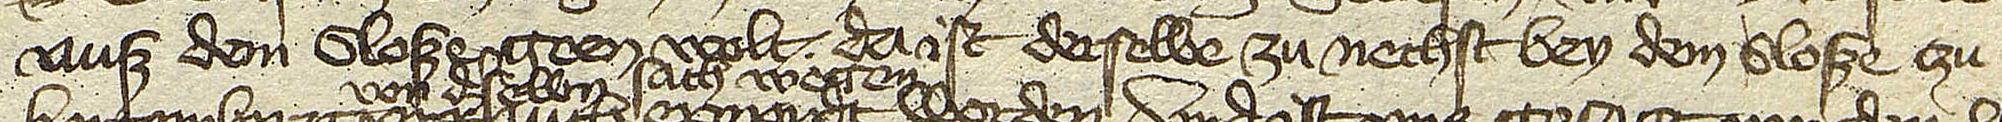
auſʒ dem Sloſʒe geen wolt / . da iſt derſelbe cʒu nechſt bey dem Sloſʒe cʒu
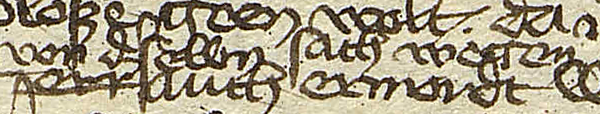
von d*ſelbn ſach wegen
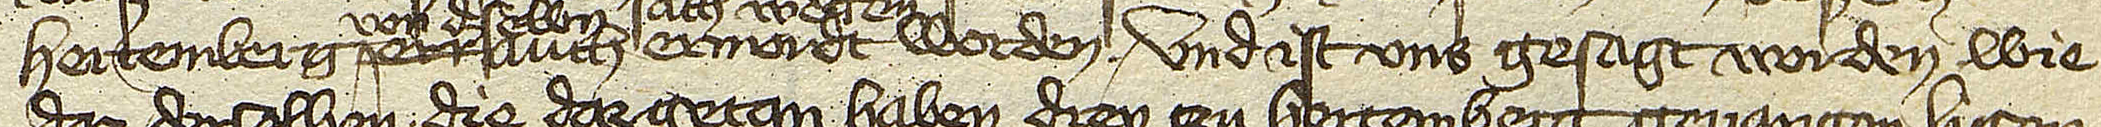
hertemberg err* auch ermordt worden . / Vnd iſt vns geſagt worden wie
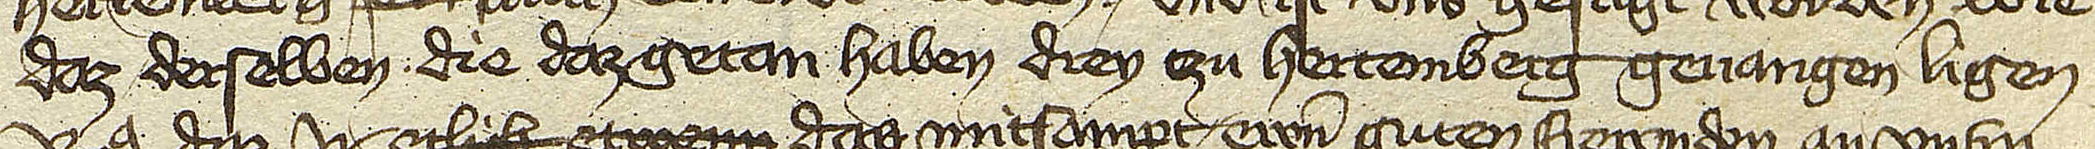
daʒ / derſelben . die daʒ getan haben drey cʒu hertemberg geuangen ligen
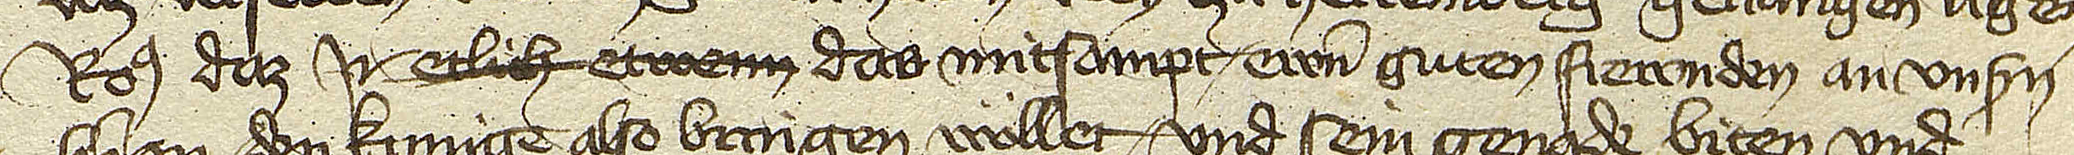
Ro* daʒ Ir etlich etwenn das mitſampt / ewn* guten frewnden an vnſ*n
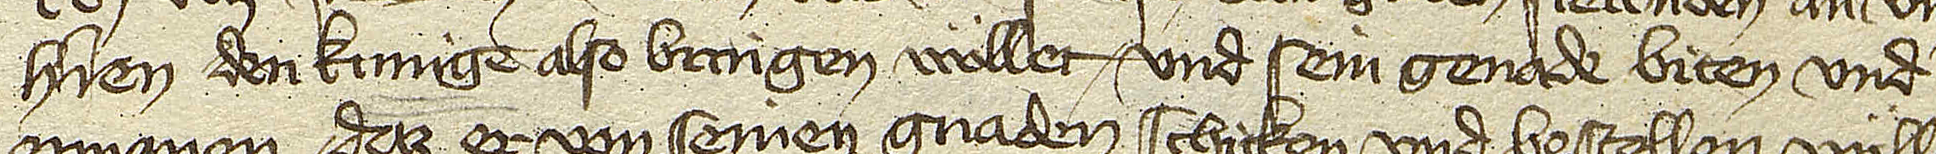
h*ren den kunige alſo bringen wöllet / vnd ſein genade biten vnd
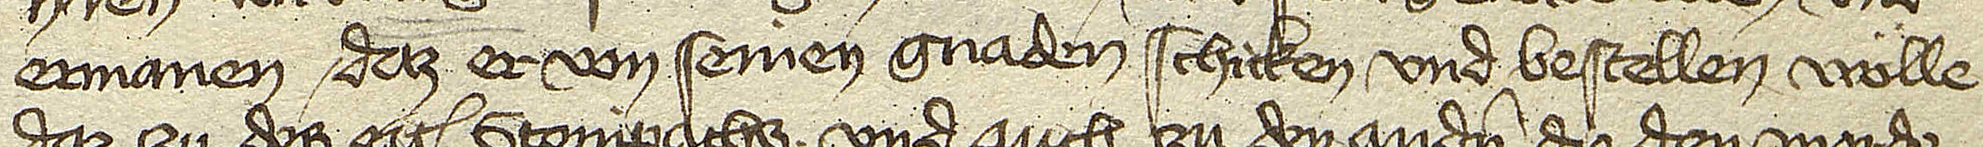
ermanen / daʒ er von ſeinen gnaden ſchicken vnd beſtellen wölle
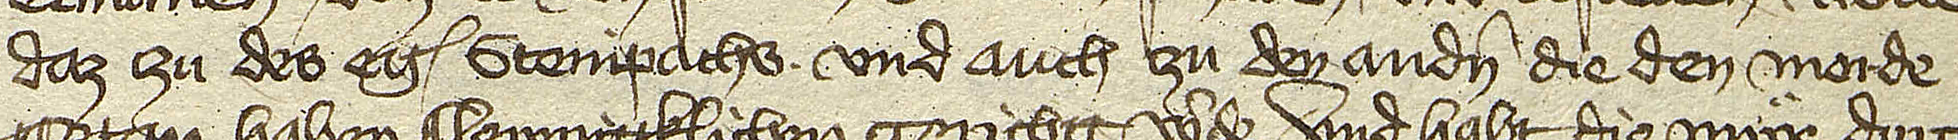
daʒ cʒu des eg* Steinpachs vnd auch cʒu den andn* die den morde
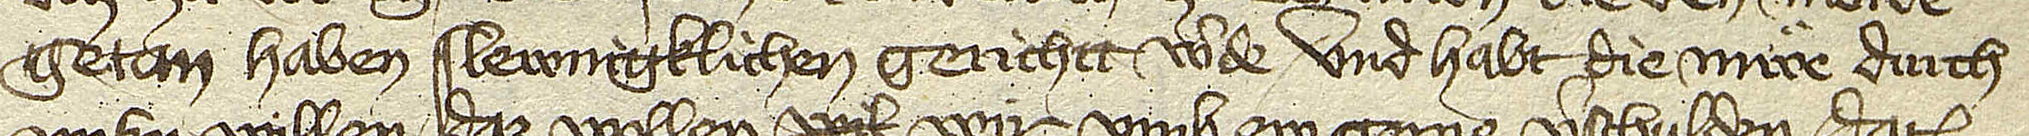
getan haben ſlewnigklichen gerichtt w*de / Vnd habt die mwe durch
